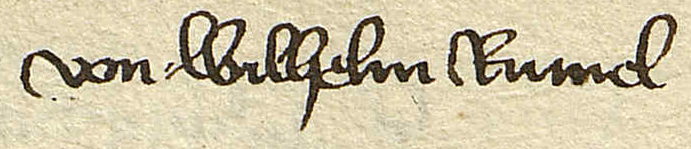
von wilhelm Rumel
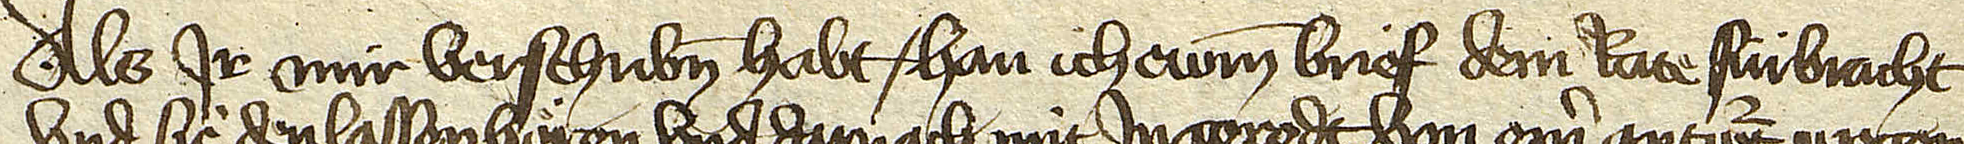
Als Ir mir verſchribn* habt / han ich ewm* bief dem Rate fürbracht
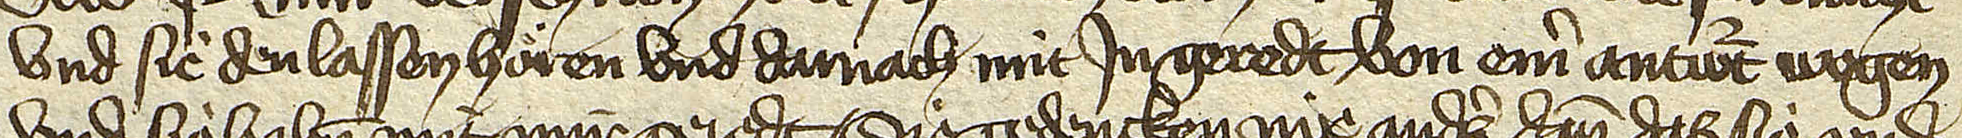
vnd ſie den laſſen hören vnd darnach mit In geredt von ein* antwt* wegen
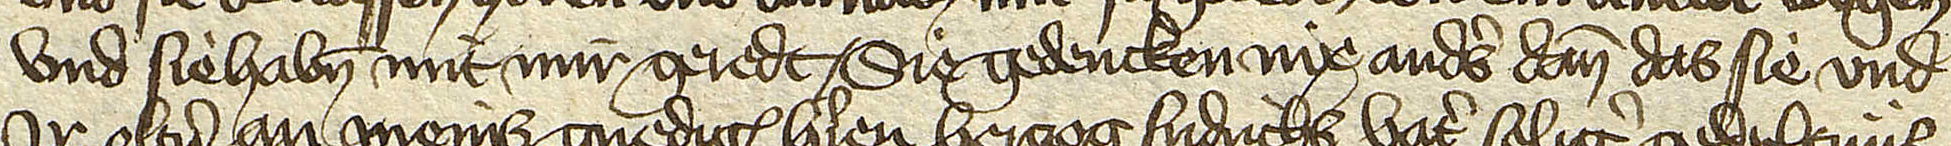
vnd ſie habn* mit mir geredt / Sie gedenken nye ands* dan* das ſie vnd
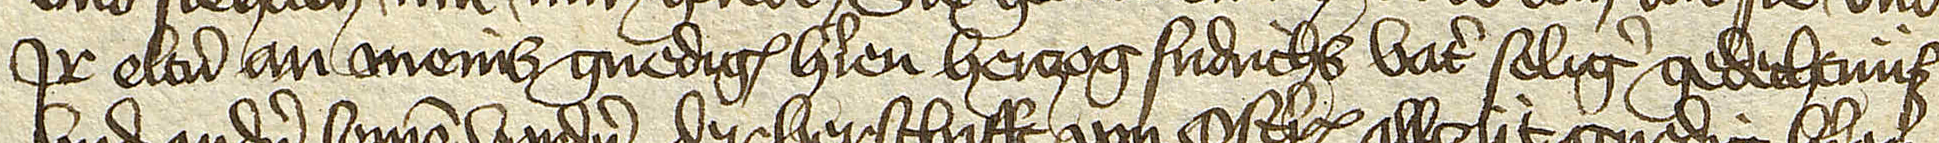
Ir eltn* an meins gnedig* h*ren hercʒog fridrichs vat* ſelig* gedechtnüſʒ
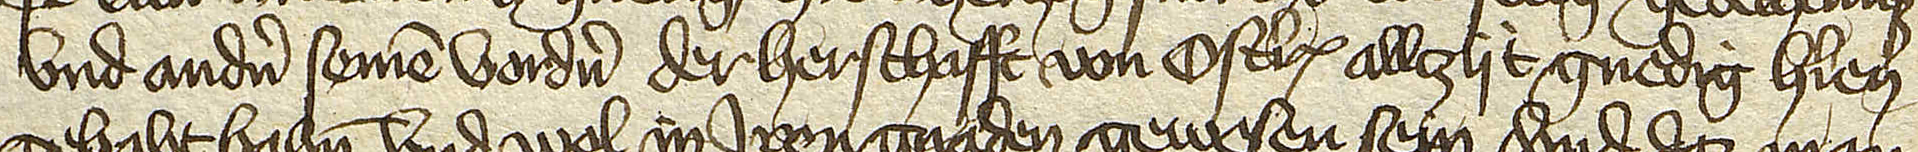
vnd andn* ſeine* vordn* der herſchafft von Oſt*r* allcʒyt gnedig h*ren
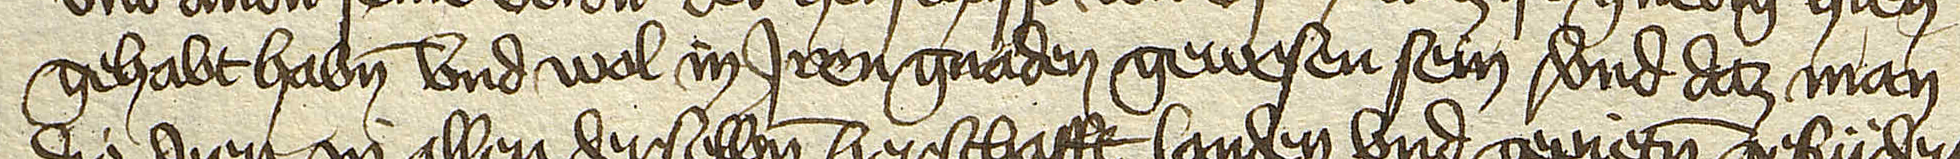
gehabt habn* vnd wol in Iren gnaden geweſen ſein / vnd daʒ man
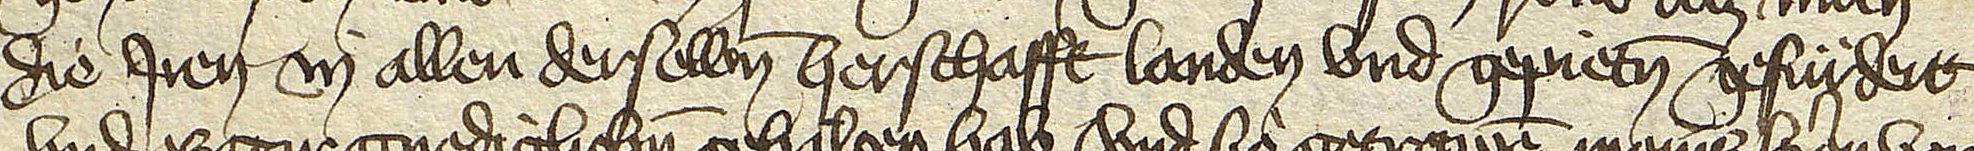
die Iren in allen derſelbn* herſchafft landen vnd gepietn* gefürdert
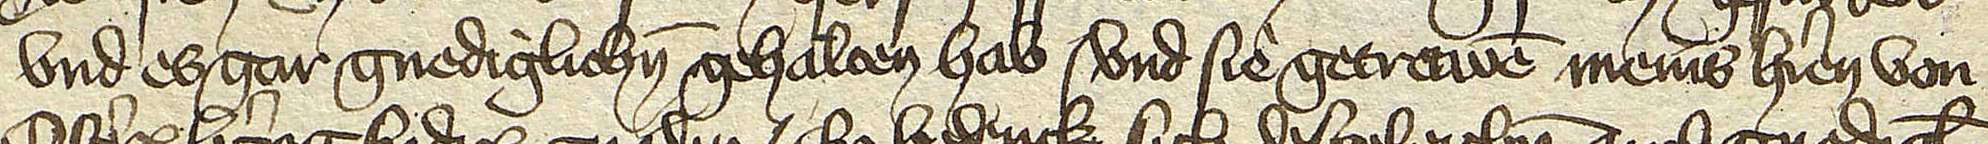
vnd es gar gnediglichn* gehalten hab / vnd ſie getrawe* meins hr*en von
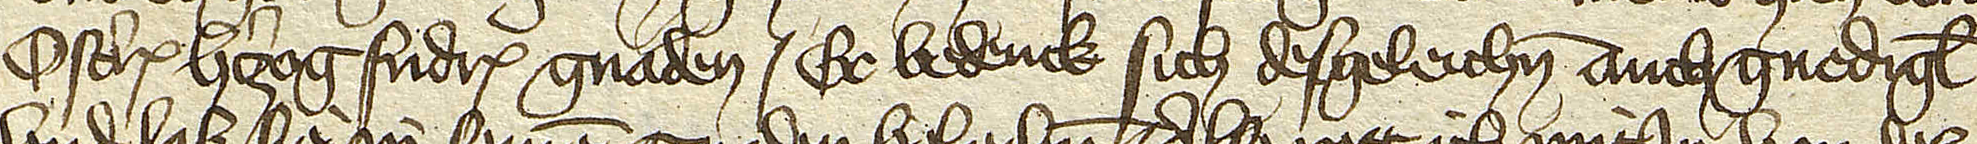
Oſt*r* h*cʒog fridr* gnaden / Er bedenck ſich deſgeleichn* auch gnedigl*
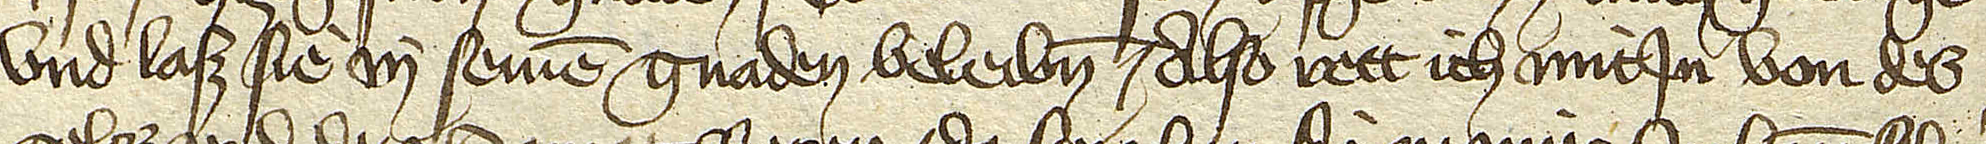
vnd laſʒ ſie in ſeine* gnaden beleibn* / Alſo rett ich mit In von des
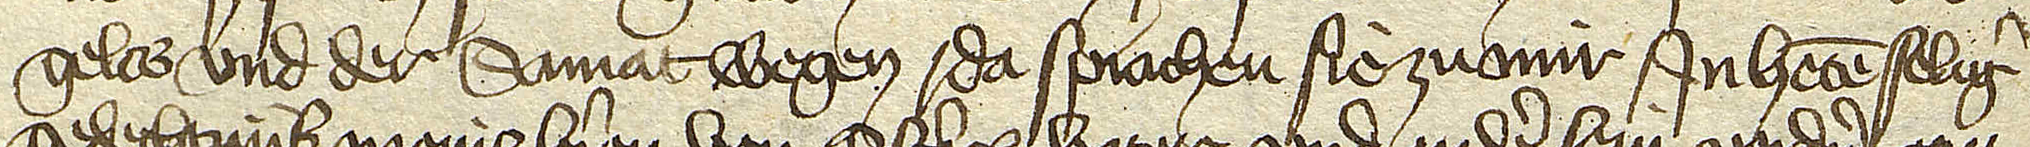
gelts vnd der Samat wegen / da ſprachen ſie cʒu mir / In hete* ſelig*
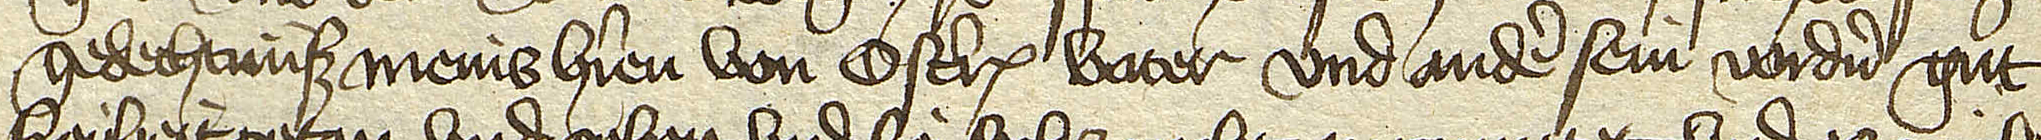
gedechtnüſʒ meins h*ren von Oſt*r* vater vnd ande* ſein vordn* gut
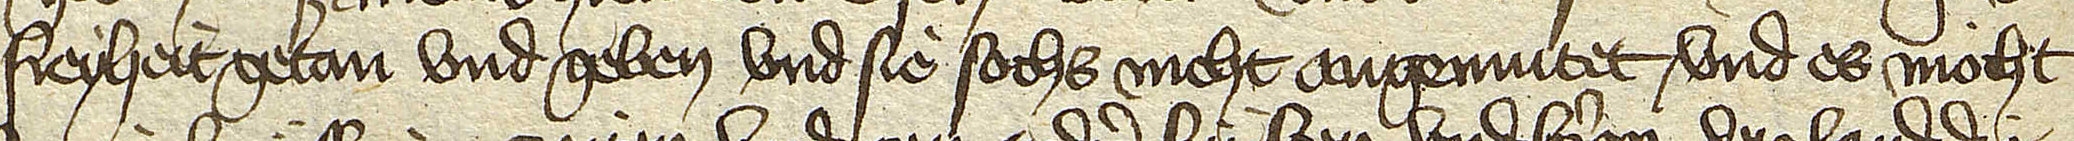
freyheit getan vnd geben vnd ſie ſochs nicht angemutet / vnd es möcht
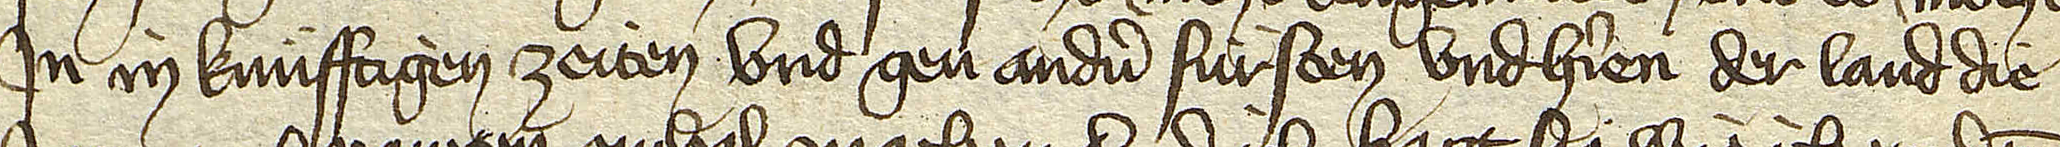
In in künfftigen cʒeiten vnd gen andn* fürſten vnd hr*en der land die
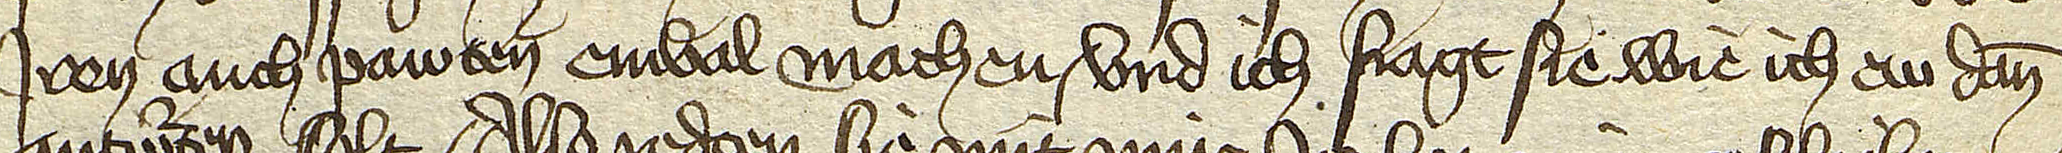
Iren auch pawten einval machen / vnd ich fragt ſie wie ich ew dan*
